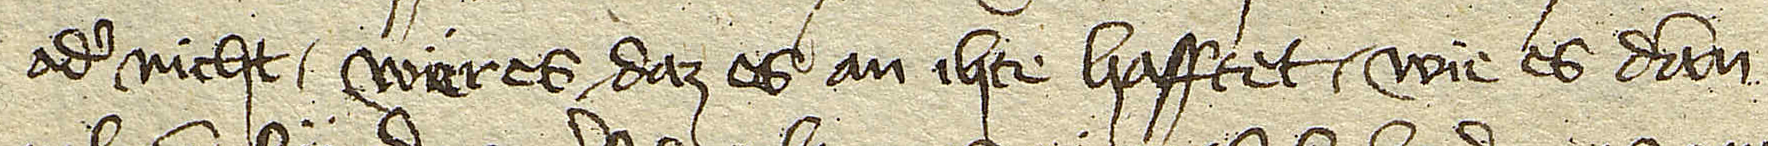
od* nicht / wär es / daʒ es an ihte hafftet / wie es dan*
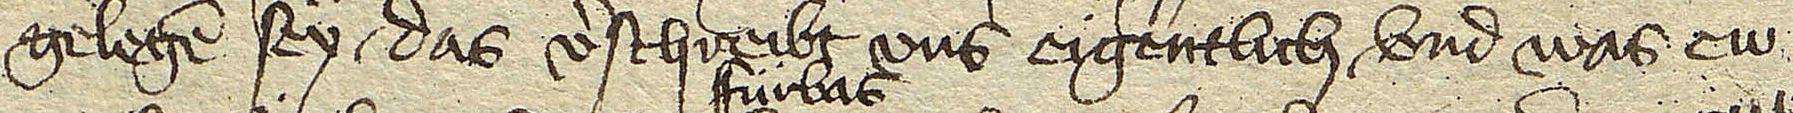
gelege* ſey / das v*ſchreibt vns eigentlich / vnd was ew
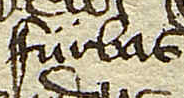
fürbas
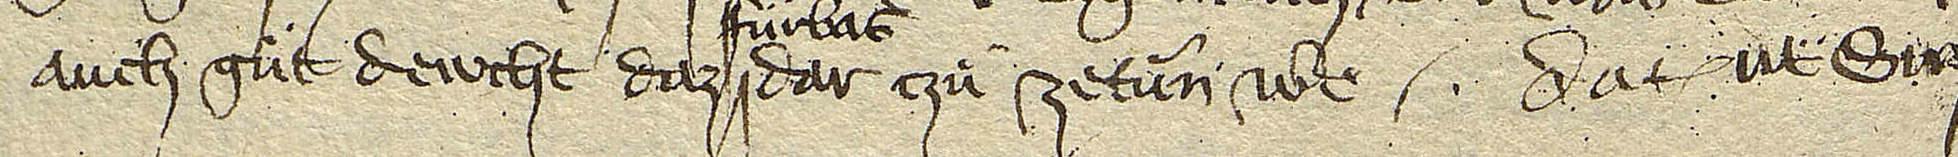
auch güt dewcht daʒ dar cʒü cʒetun w*e / . Dat* ut Sup*
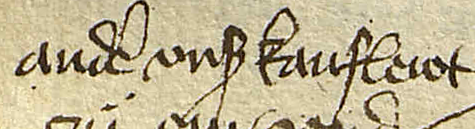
ande* vnſ* kauflewt
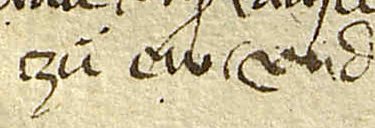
cʒü ew / vnd
